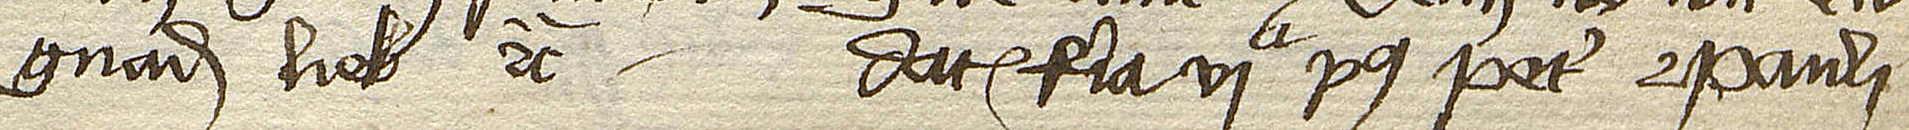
gnad* lieb ec* / dat* fi*a vi* p* Pet* @ Pauli
